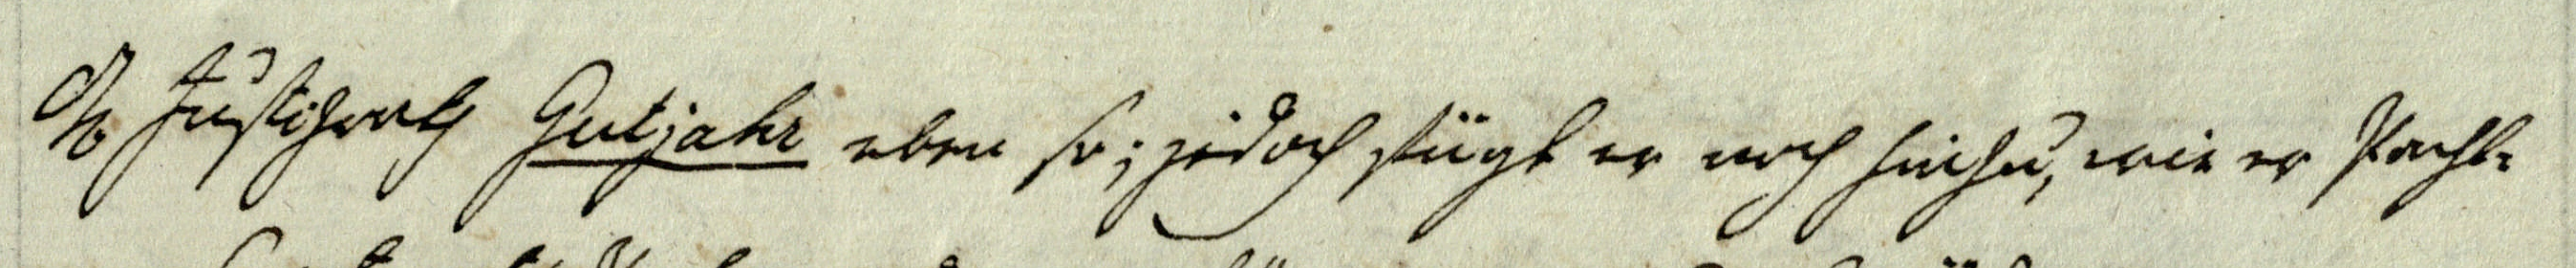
dh. Justizrath Gutjahr eben so; jedoch füget er noch hinzu, wie er Pacht¬
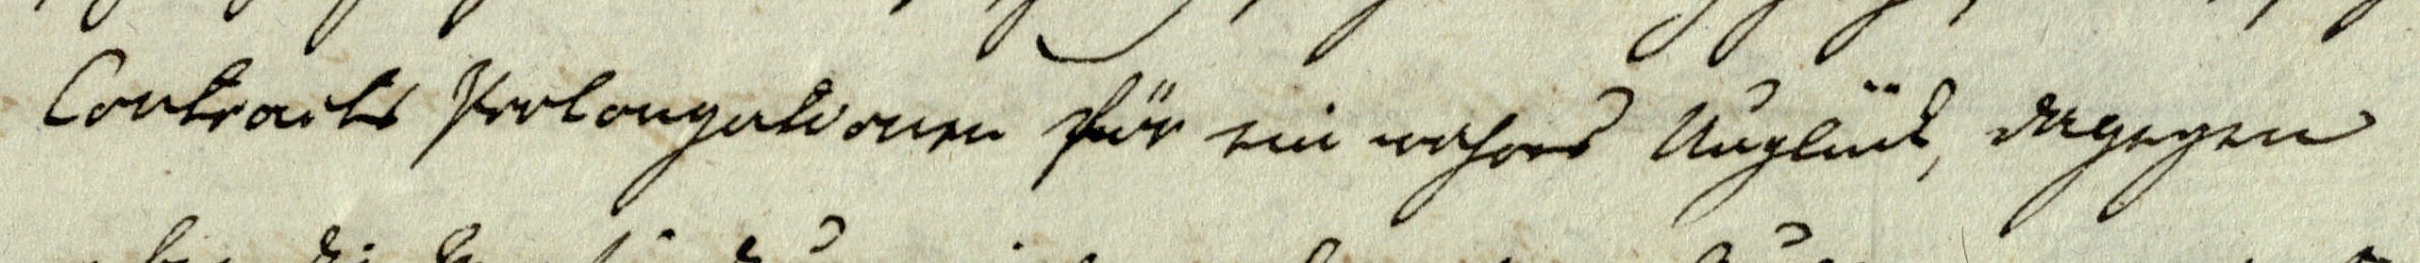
Contracts Prolongationen für ein wahres Unglück, dagegen
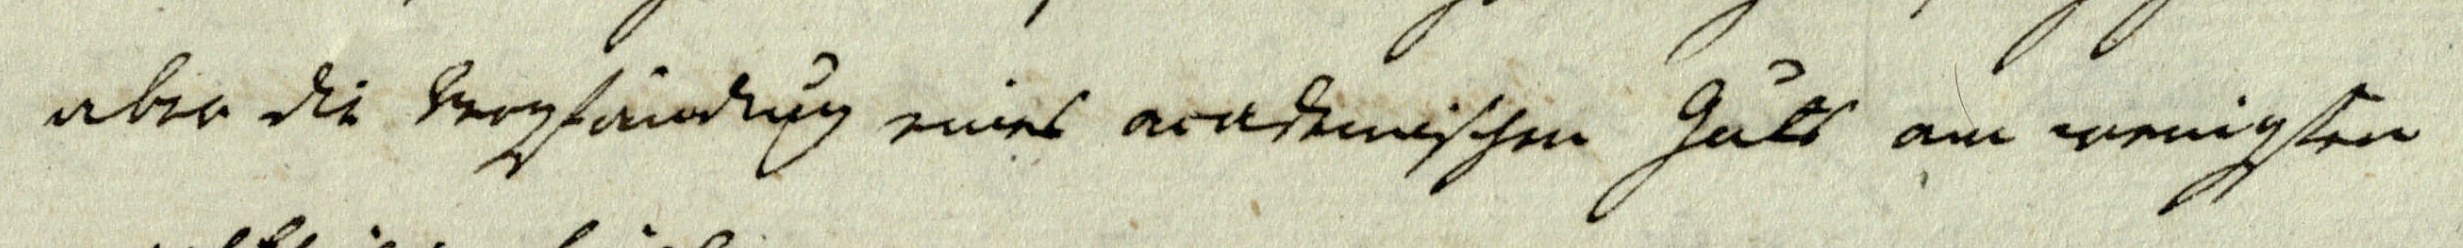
aber die Verpfändug eines academischen Guts am wenigsten
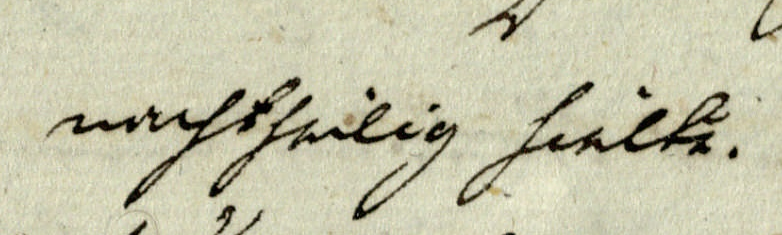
nachtheilig hielte.
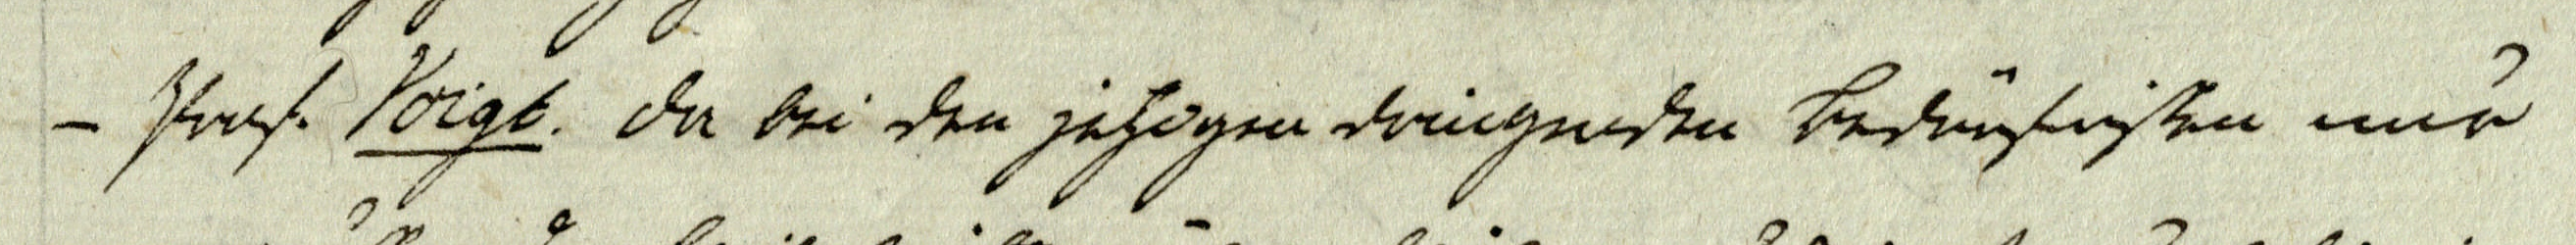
Prof. Voigt. Da bei den jetzigen dringenden Bedürfnissen nur
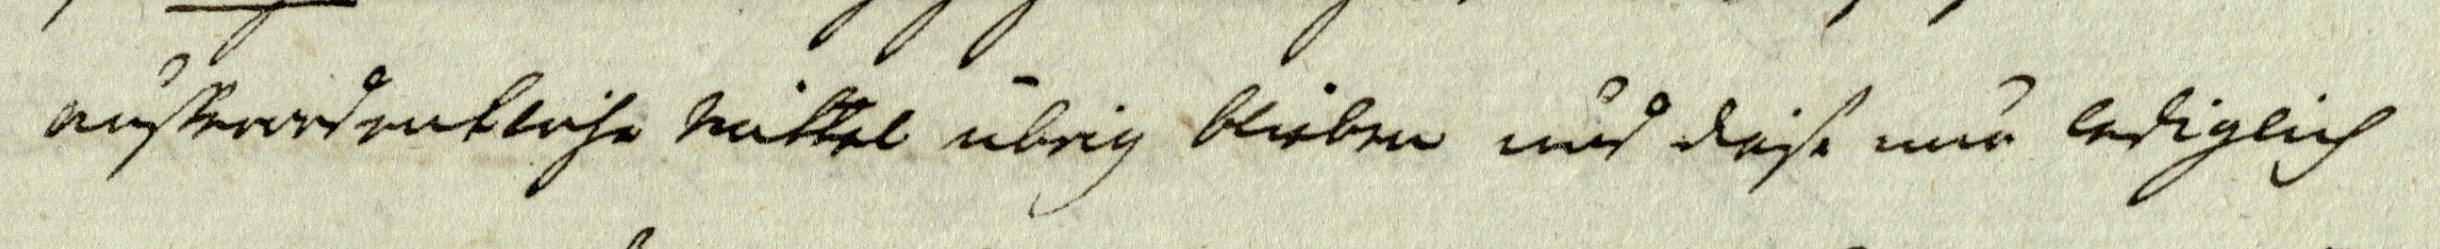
ausserordentliche Mittel übrig blieben und diese nur lediglich
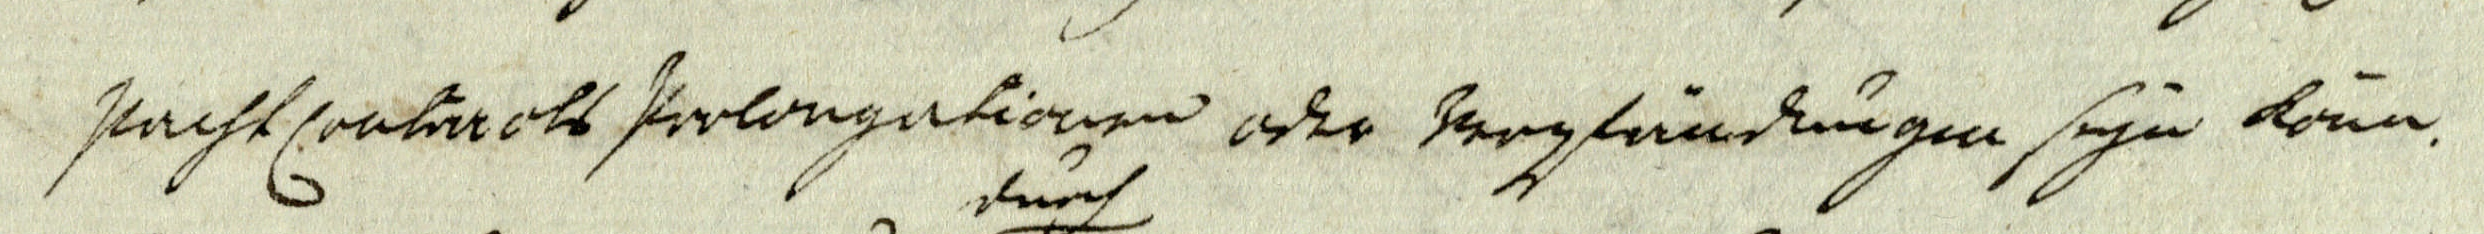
Pacht Contracts Prolongationen oder Verpfändungen seÿn könn¬
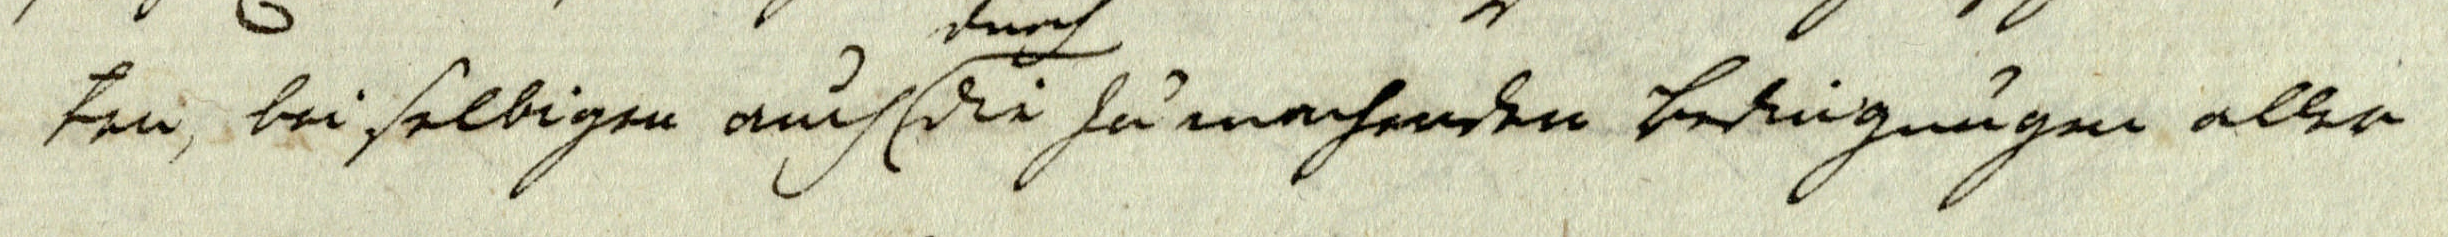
ten, bei selbigen auch durch die zu machenden Bedingungen aller
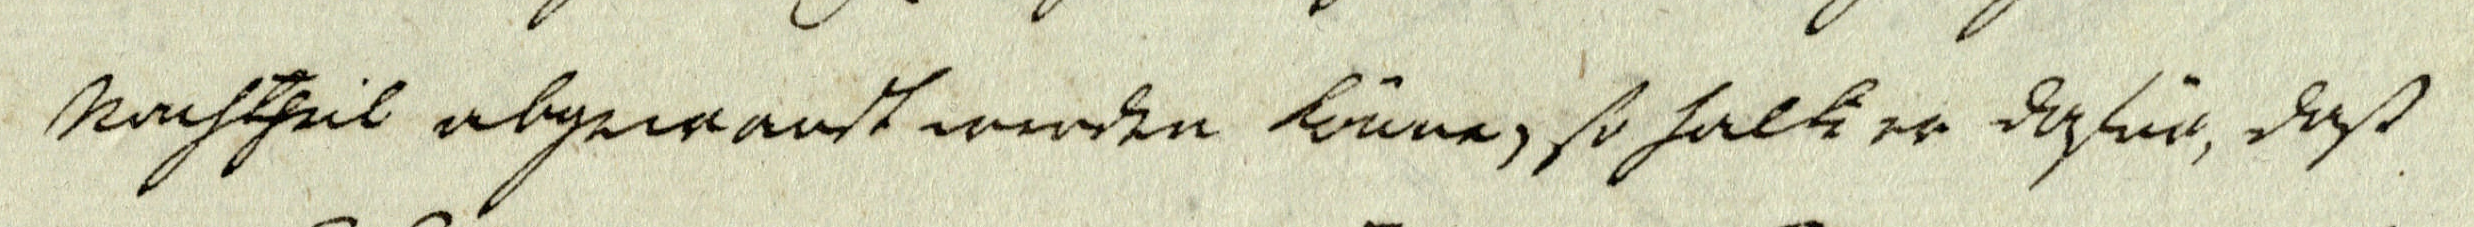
Nachtheil abgewandt werden könne, so halte er dafür, daß
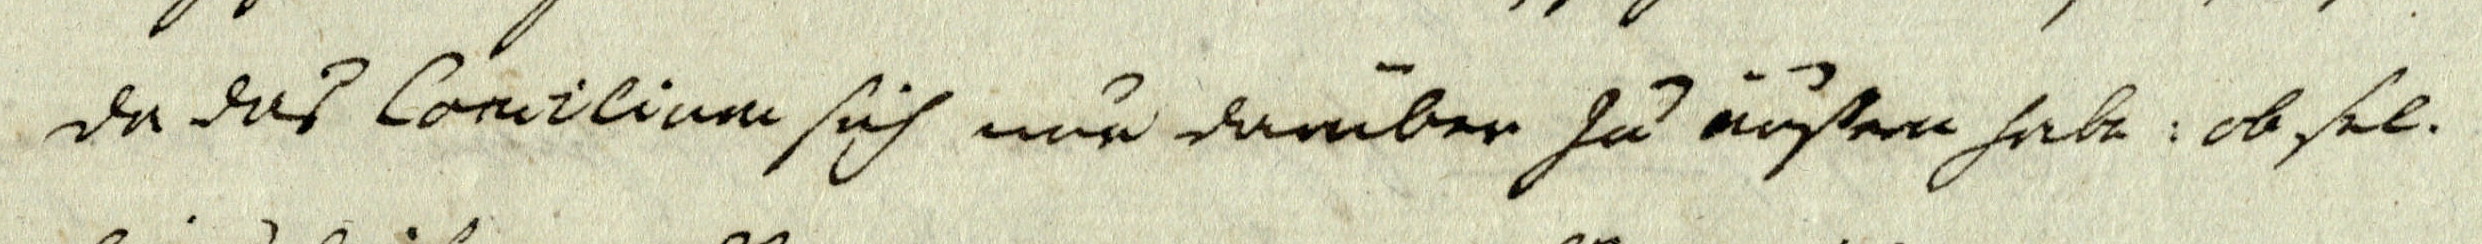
da das Concilium sich nur darüber zu äussern habe: ob sel¬
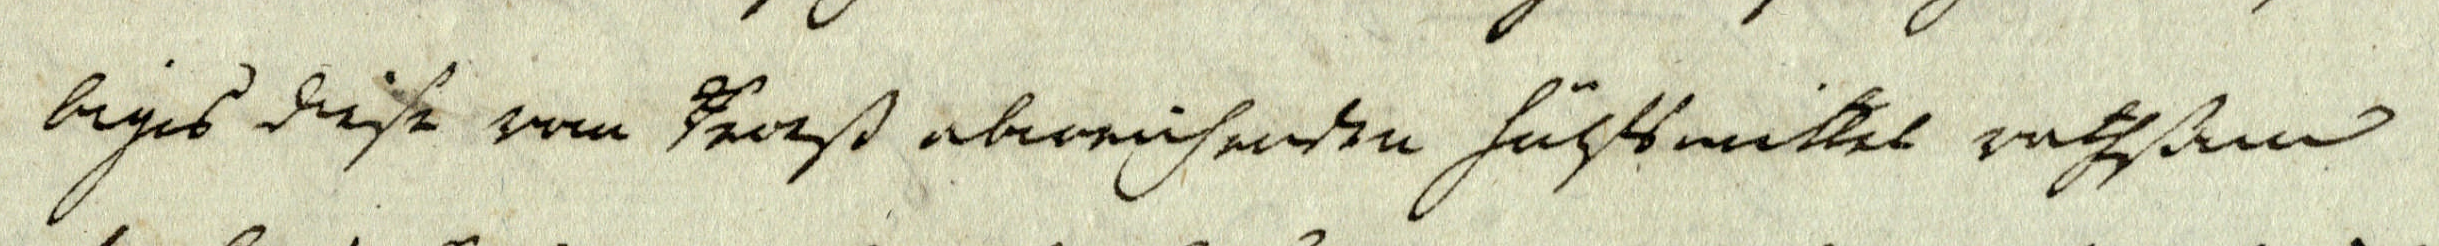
biges diese vom Receß abweichenden Hülfsmittel rathsam
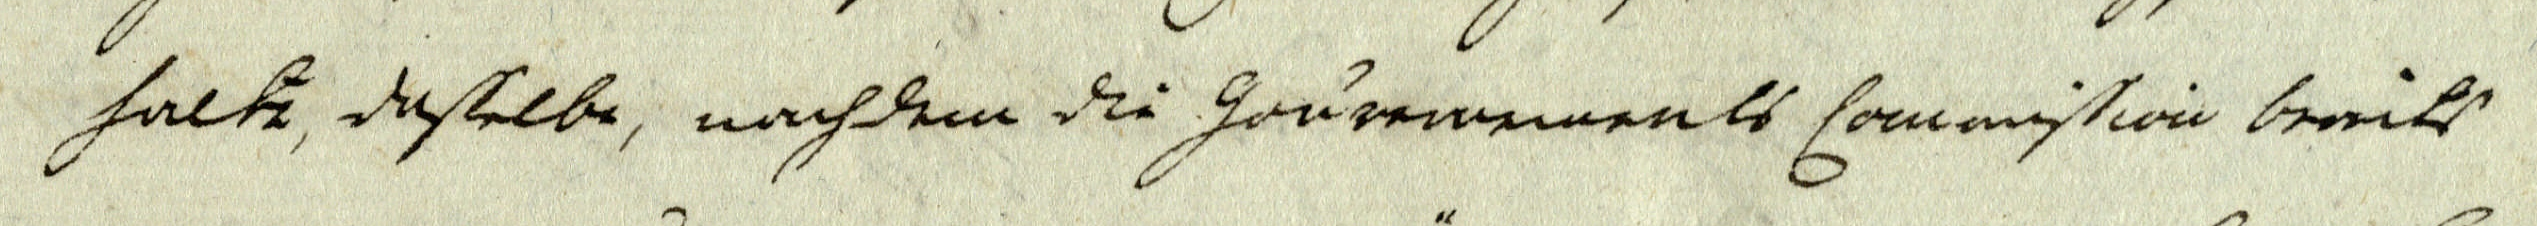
halte, dasselbe, nach dem die Gouvernements Commission bereits
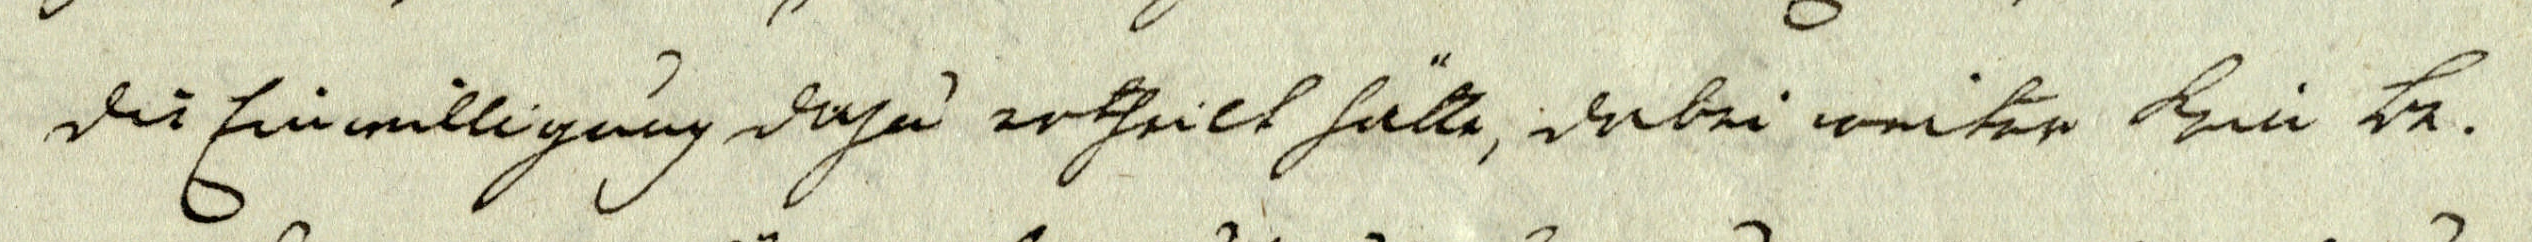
die Einwilligung dazu ertheilt hätte, dabei weiter kein Be¬
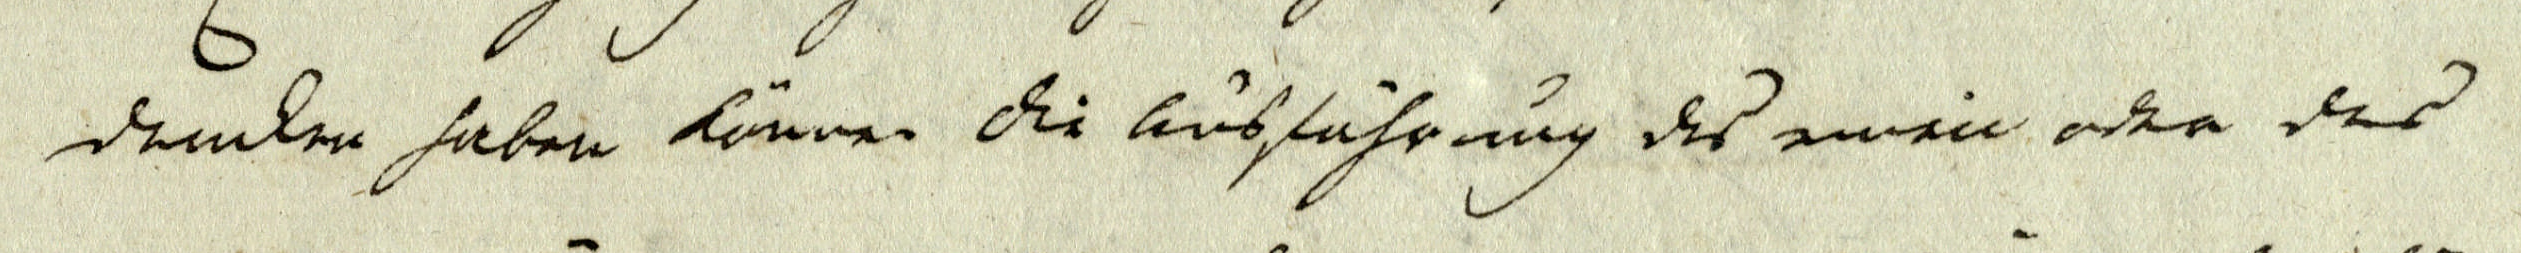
denken haben könne. Die Ausführung des einen oder des
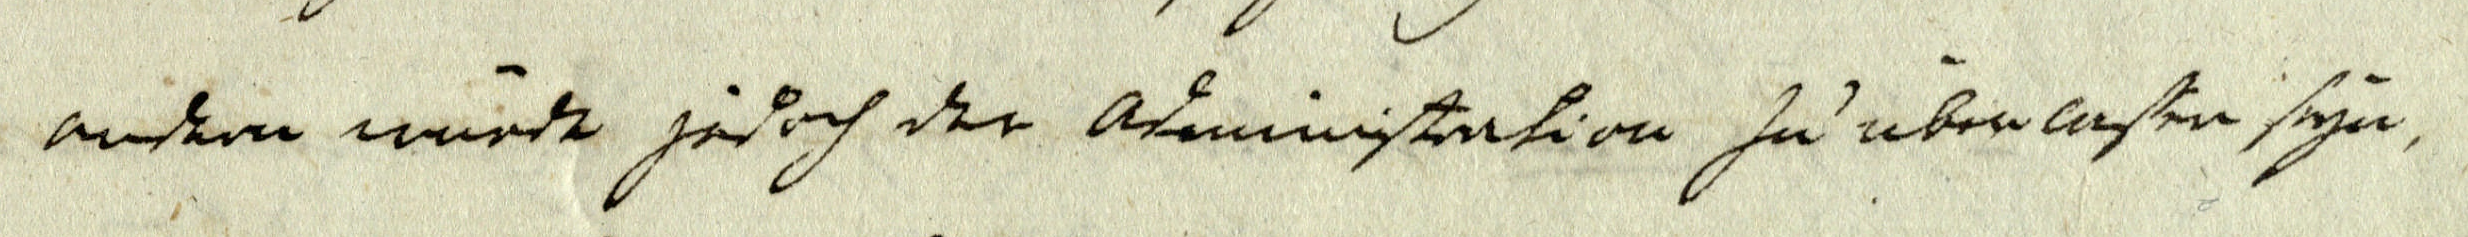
andern würde jedoch der Administration zu über lassen seÿn,
